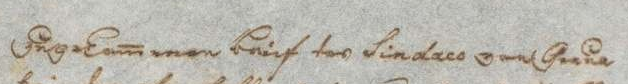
zugekommenen Brief des Sindaco von Genua
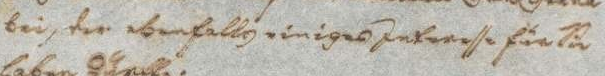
bei, der ebenfalls einiges Interesse für Sie
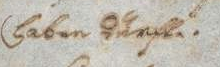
haben dürfte.
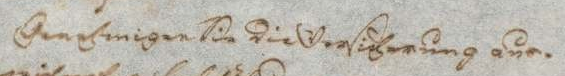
Genehmigen Sie die Versicherung aus-
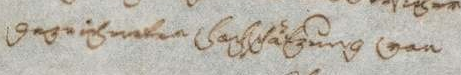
gezeichneter Hochschätzung von
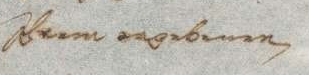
Ihrem ergebenen
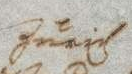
Zürich
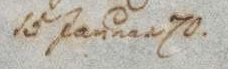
15 Januar 70.
